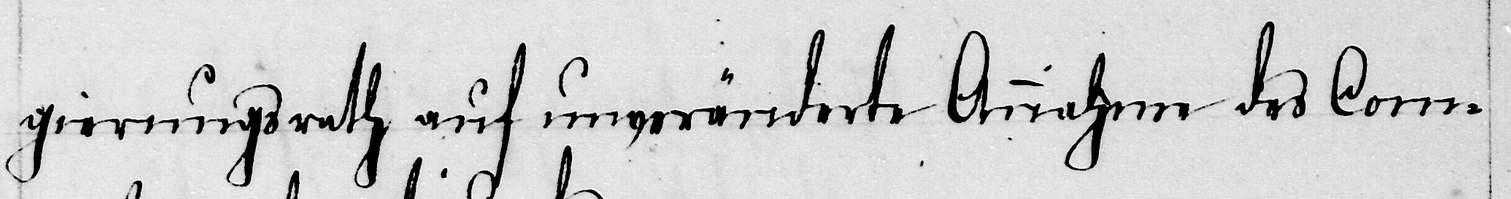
gierungsrath auf unveränderte Annahme des Com¬
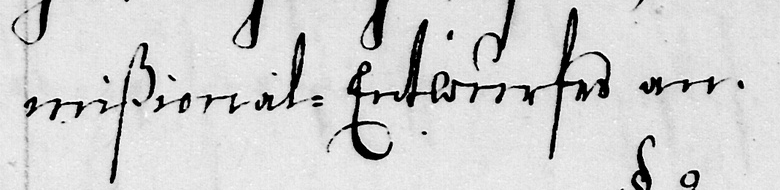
mißional-Entwurfes an.
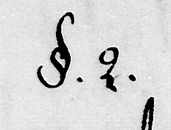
§. 2.
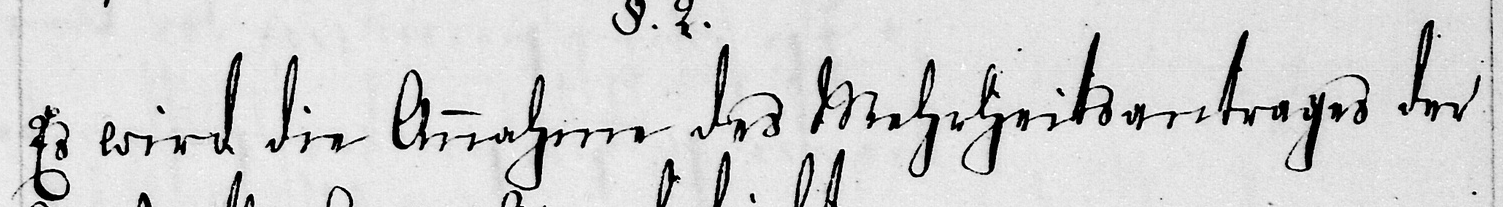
Es wird die Annahme des Mehrheitsantrages der
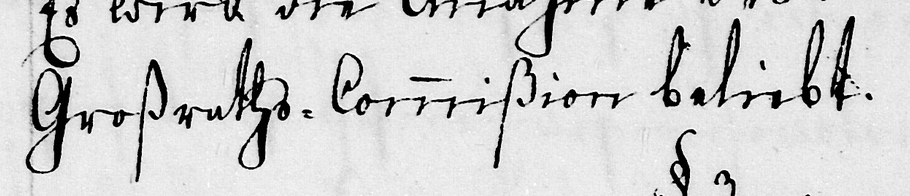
Großraths-Commißion beliebt.
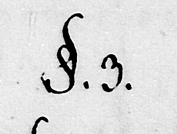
§. 3.
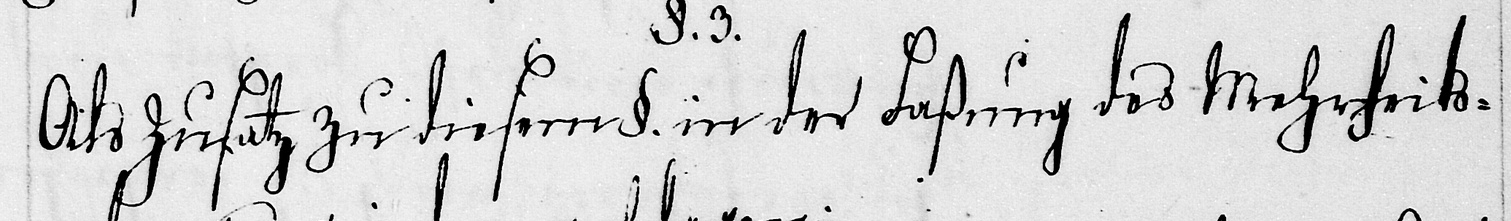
Als Zusatz zu diesem §. in der Faßung des Mehrheits¬
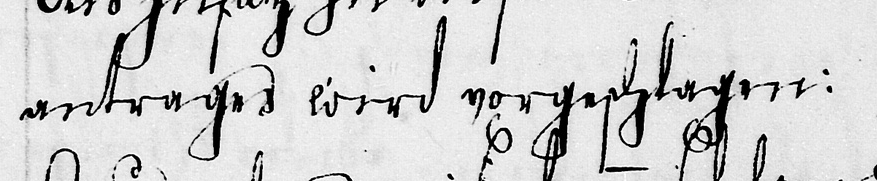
antrages wird vorgeschlagen:
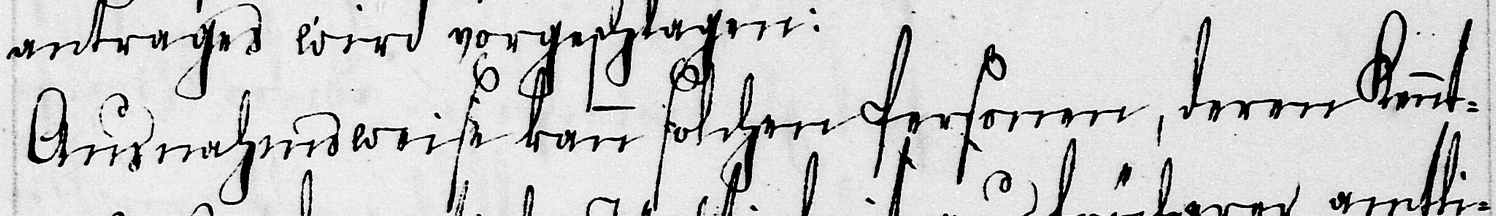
Ausnahmsweise kann solchen Personen, deren Kennt¬
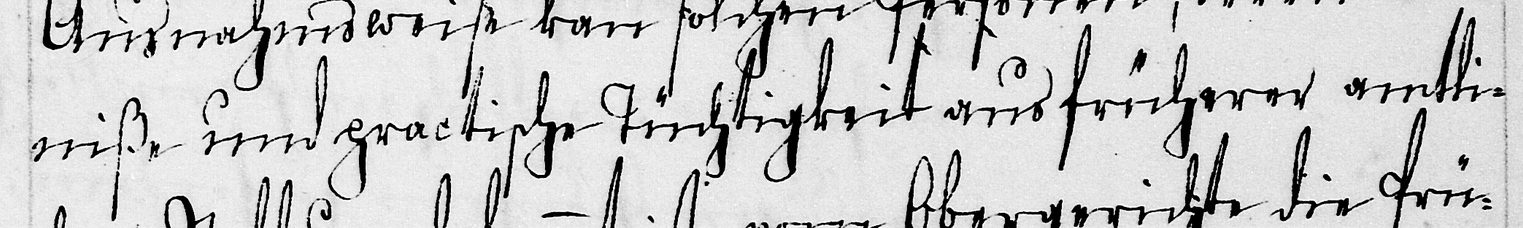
niße und practische Tüchtigkeit aus früherer amtli¬
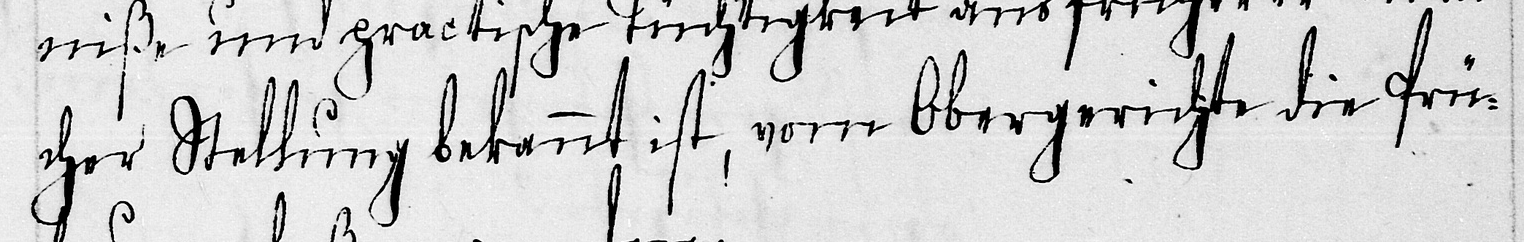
cher Stellung bekannt ist, vom Obergerichte die Prü¬
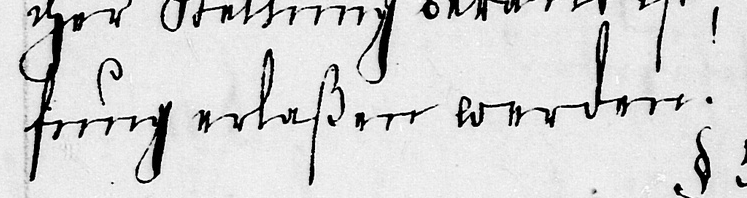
fung erlaßen werden.
